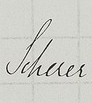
Scherer
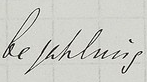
der Sitzung
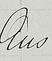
die
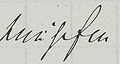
verschiedene
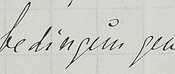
Bedingungen knüpfen.
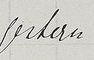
italienische
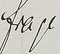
mich
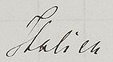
richtete
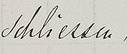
schliessen,
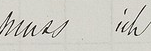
dass Italien
